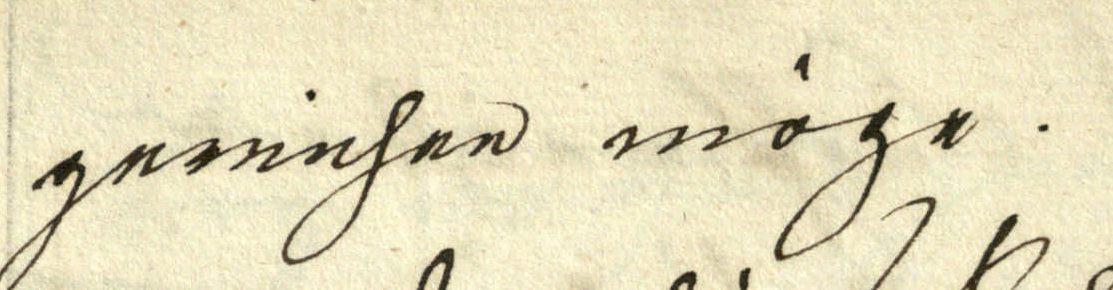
gereichen möge.
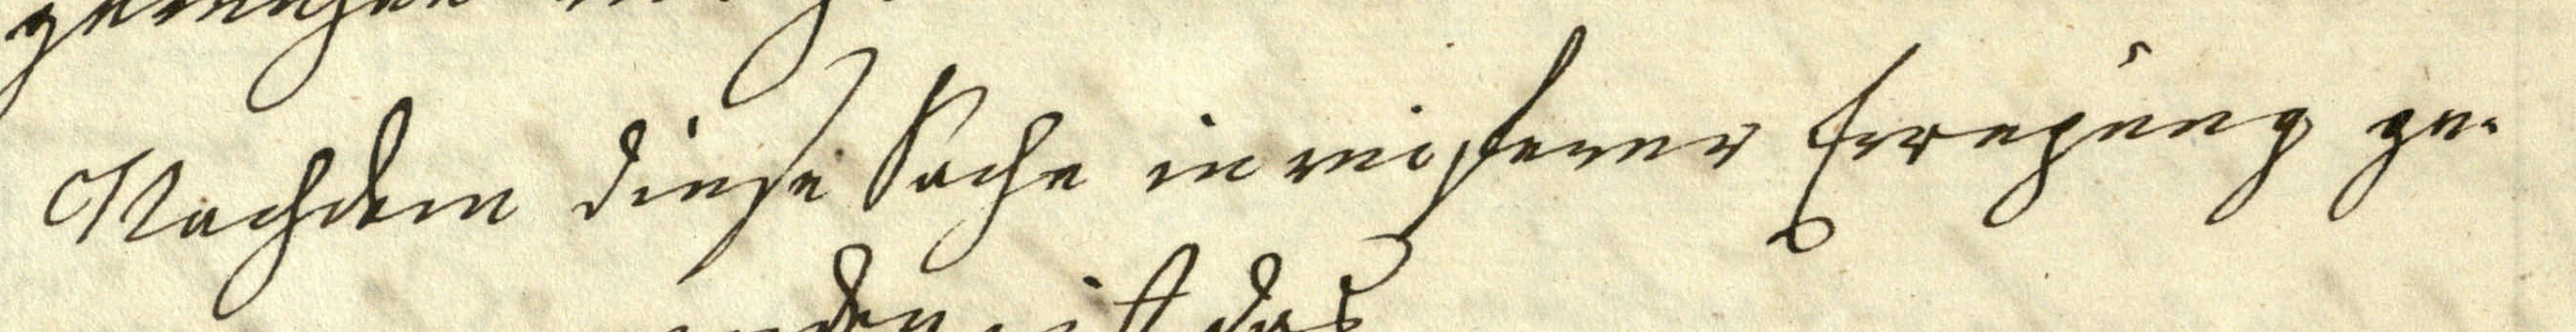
Nachdem diese Sache in reiferer Erwegung ge¬
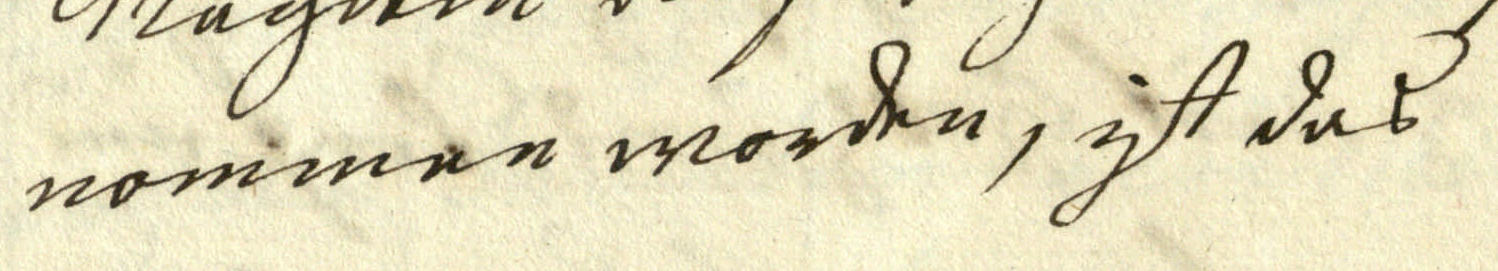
nommen worden, ist das
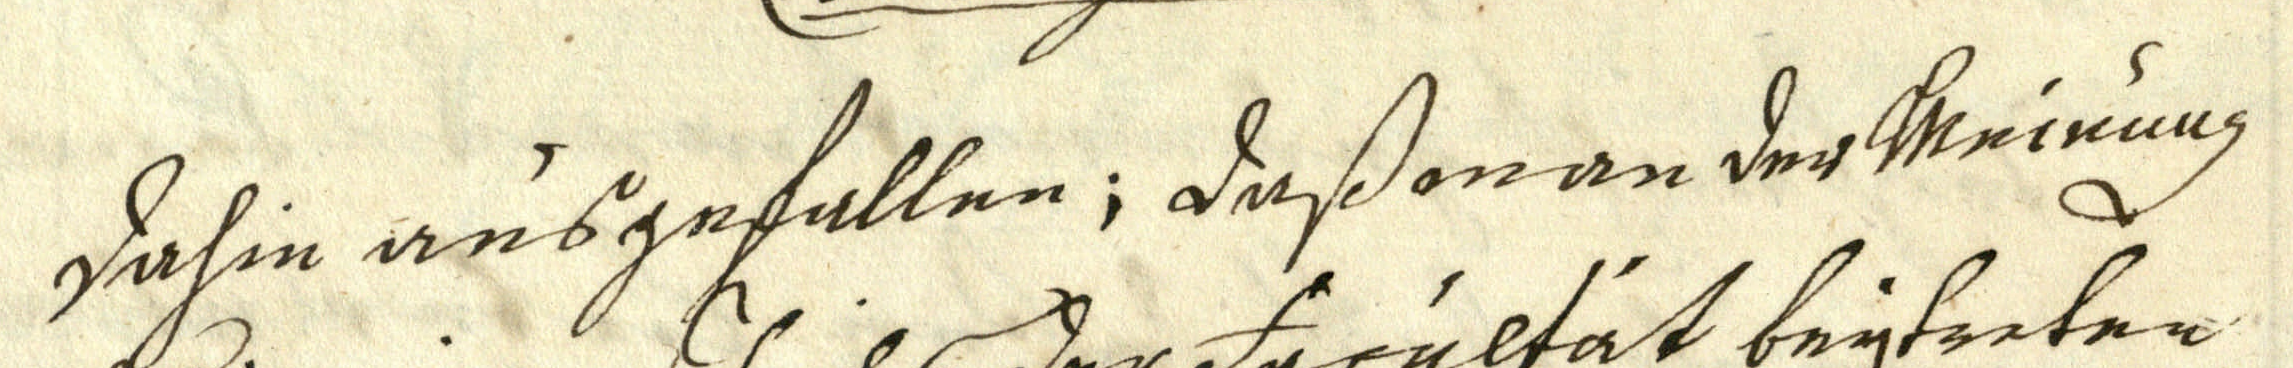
dahin ausgefallen, daß man der Meinung
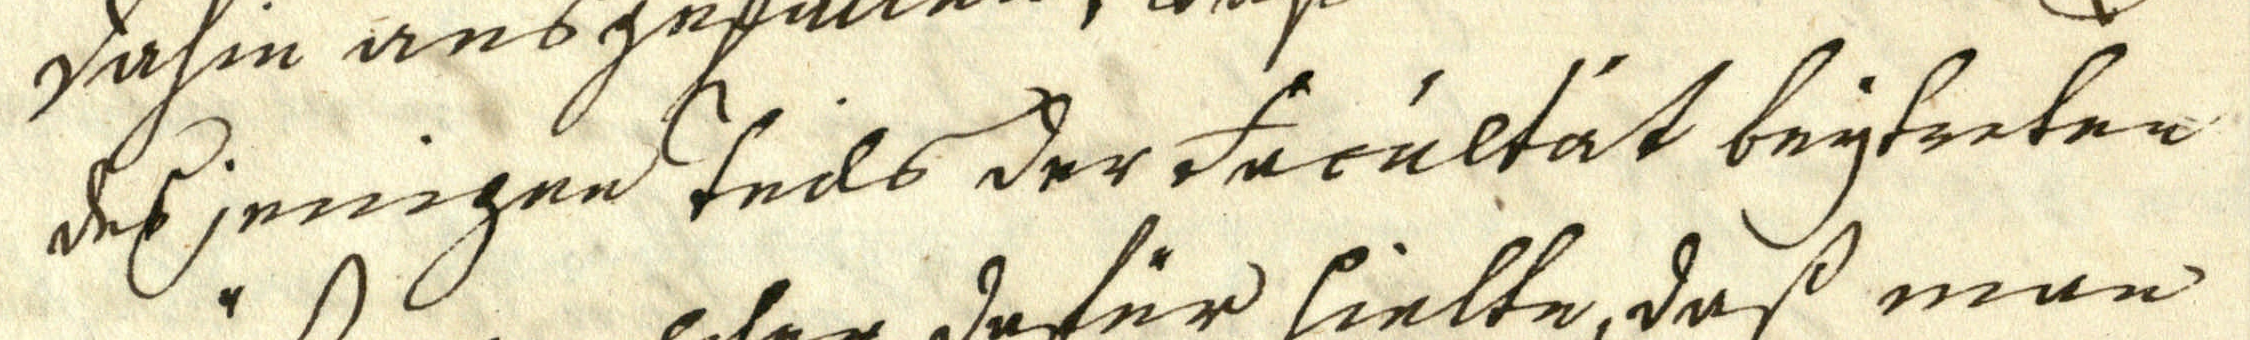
des jenigen Teils der Facultät beÿtreten
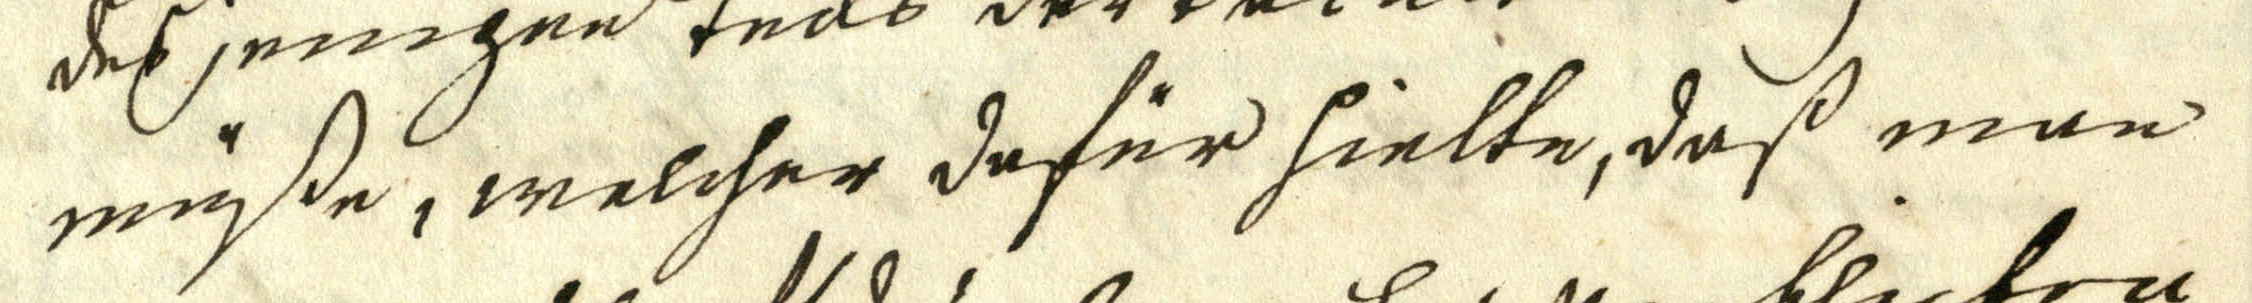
müße, welcher dafür hielte, daß man
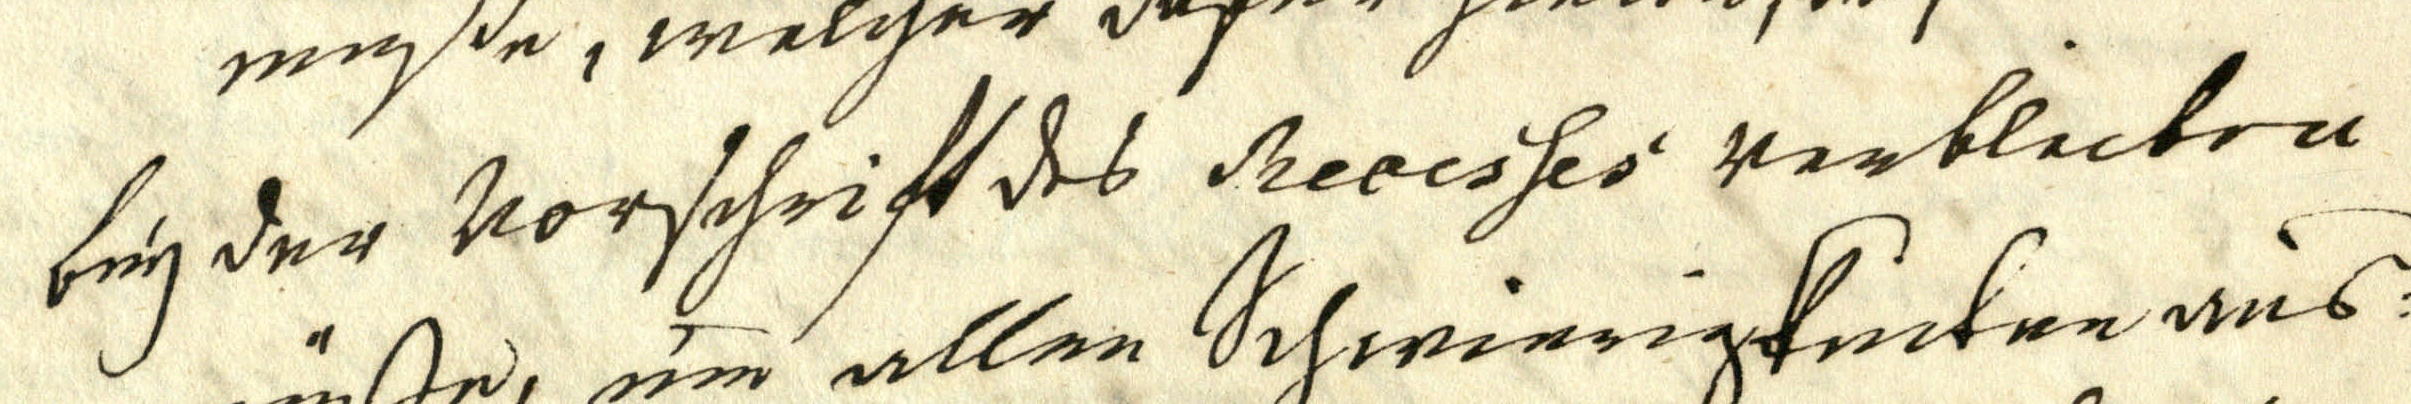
beÿ der Vorschrift des Recesses verbleiben
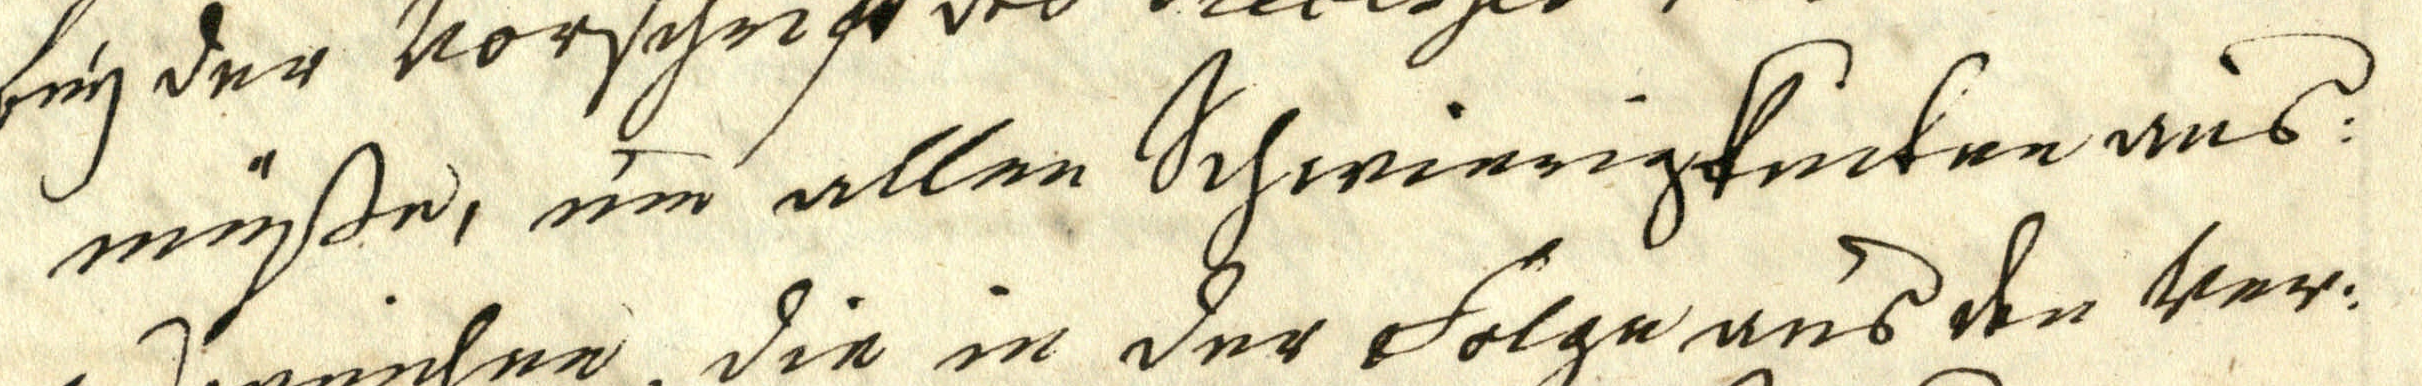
müße, um allen Schwierigkeiten aus¬
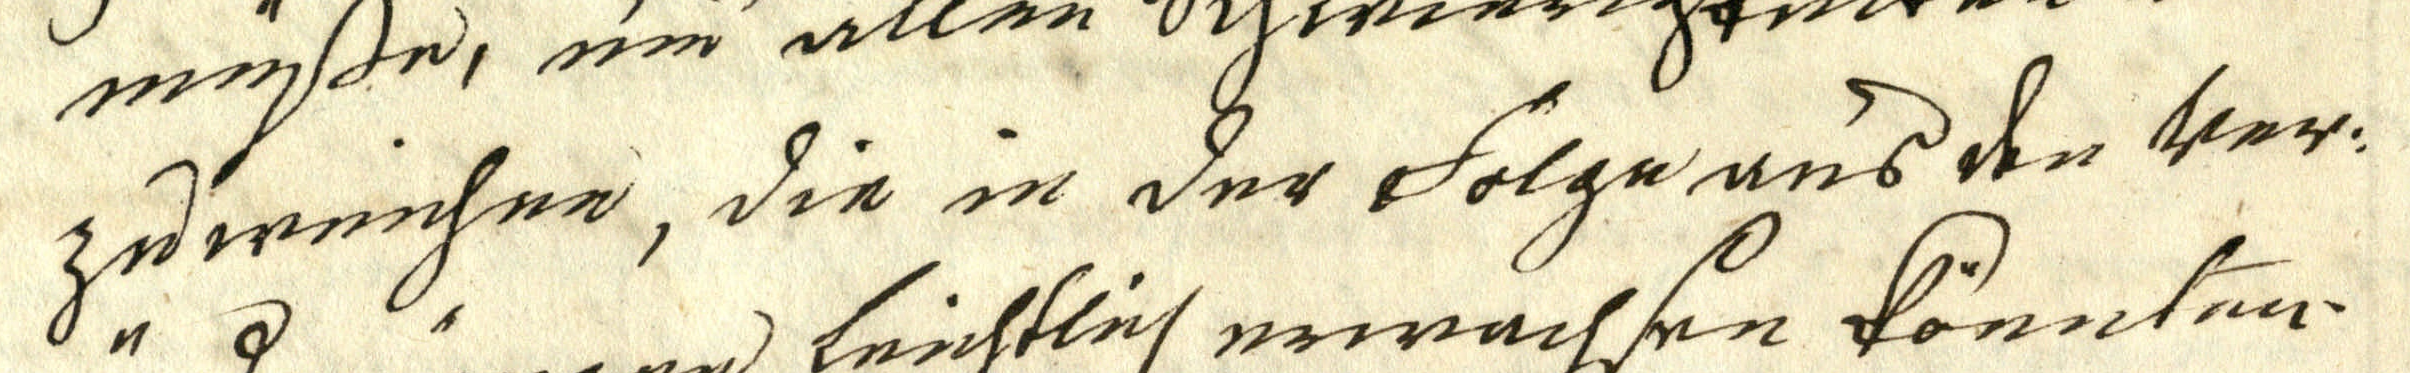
zuweichen, die in der Folge aus den Ver¬
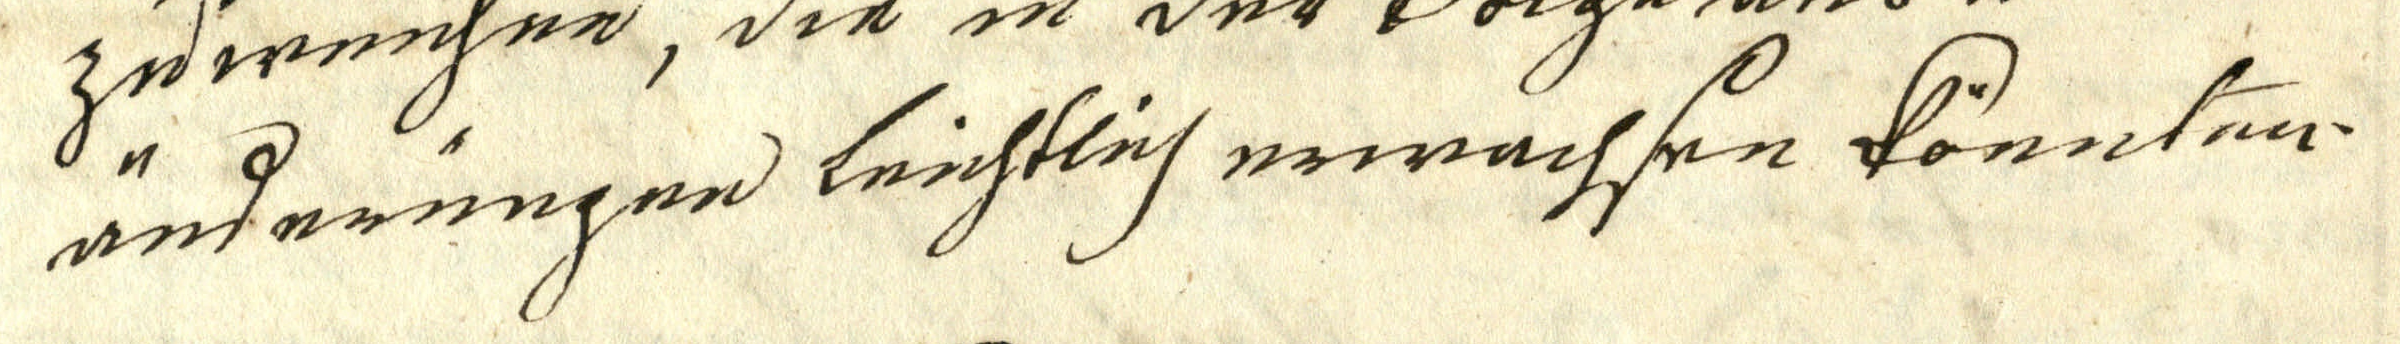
uänderungen leichtlich erwachsen könnten.
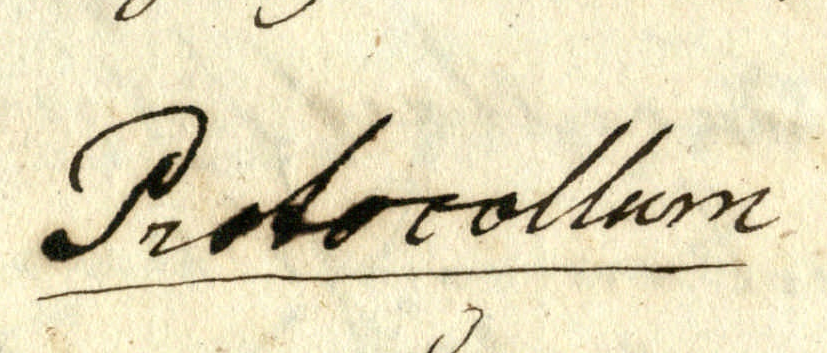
Protocollum
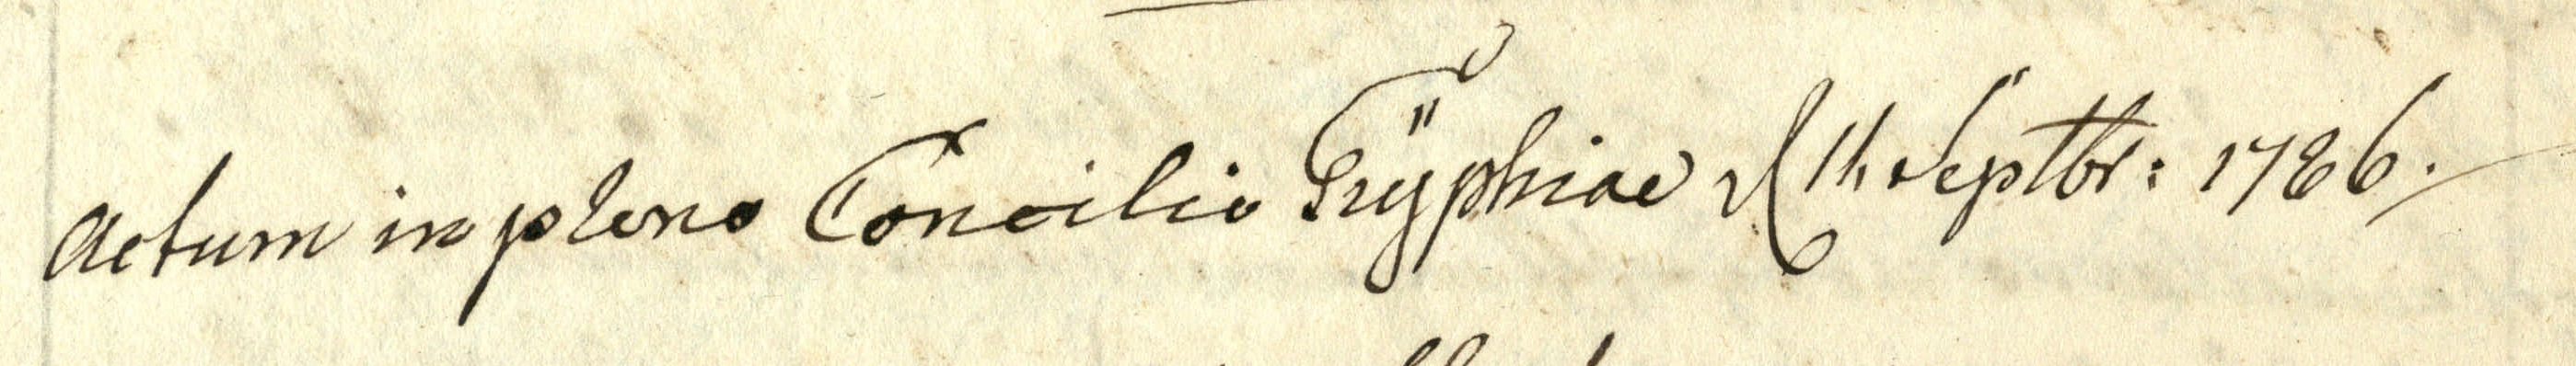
Actum in pleno Concilio Grÿphiae d.11. Septbr. 1786.
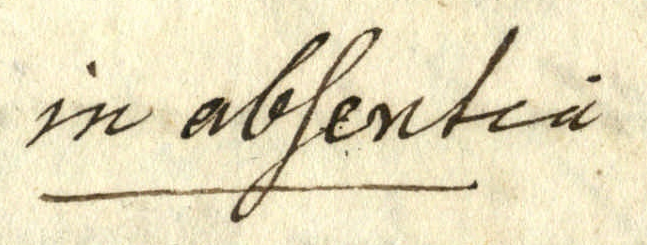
in absentia
